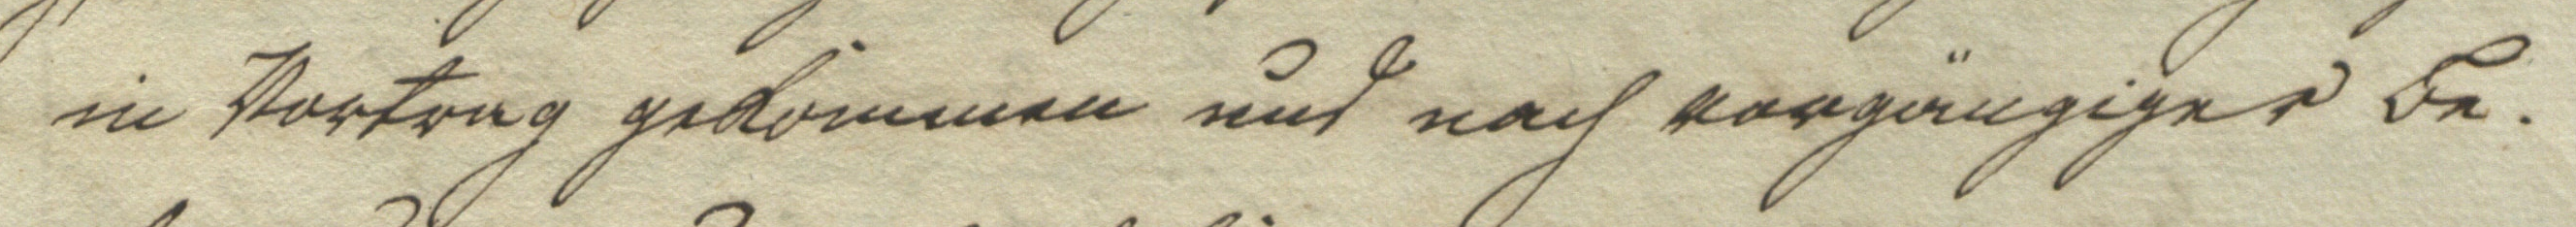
in Vortrag gekommen und nach vorgängiger Be¬
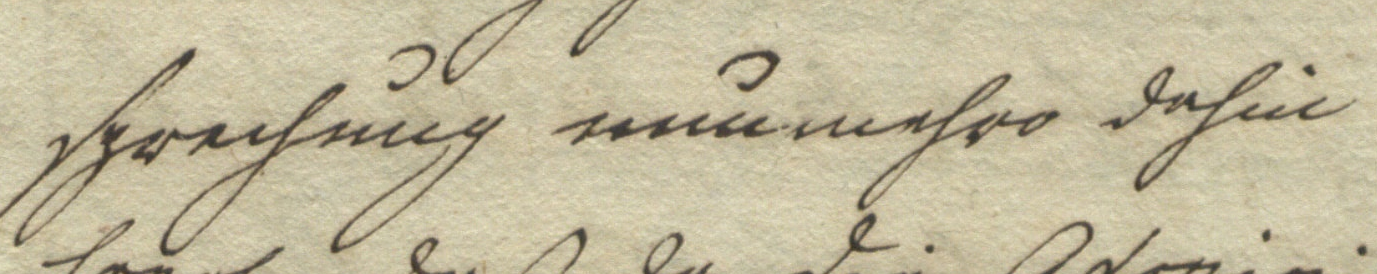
sprechung nunmehro dahin
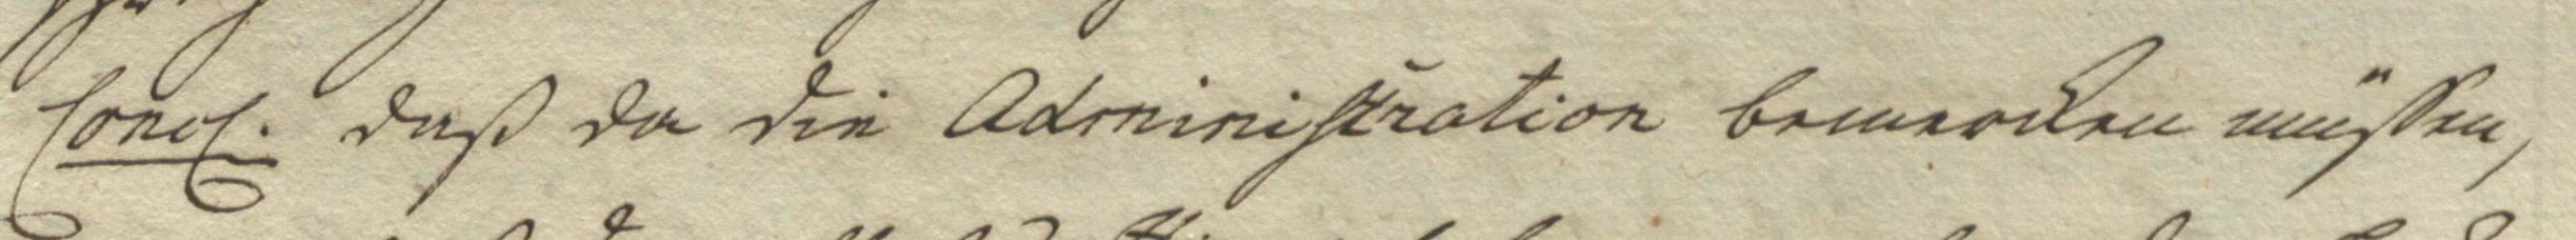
Concl. daß da die Administration bemercken müssen,
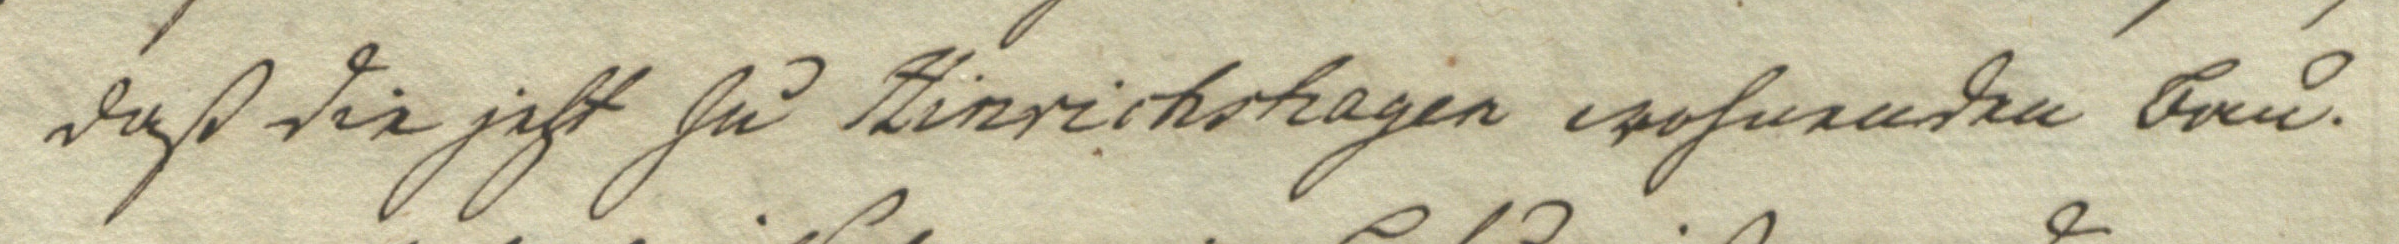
daß die jetzt zu Hinrichshagen wohnenden Bau¬
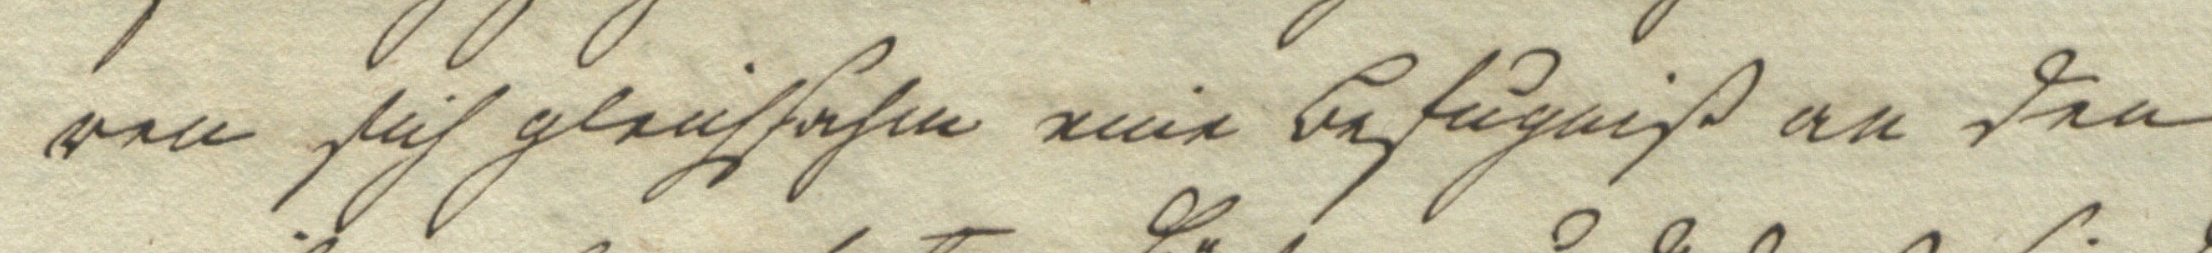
ren sich gleichsahm eine Befugniß an den
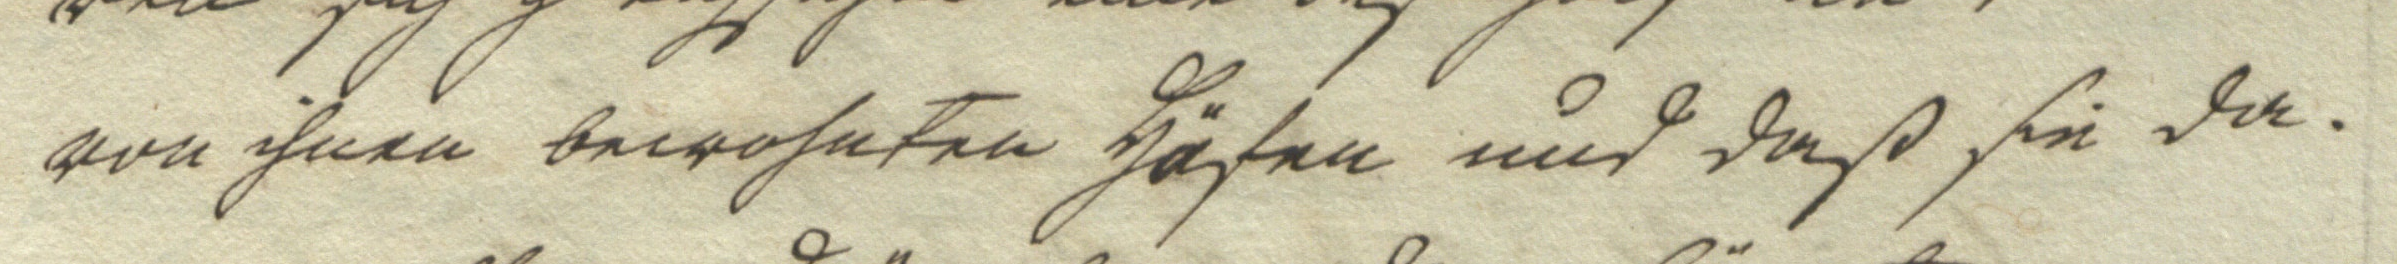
von ihnen bewohnten Höfen und daß sie da¬
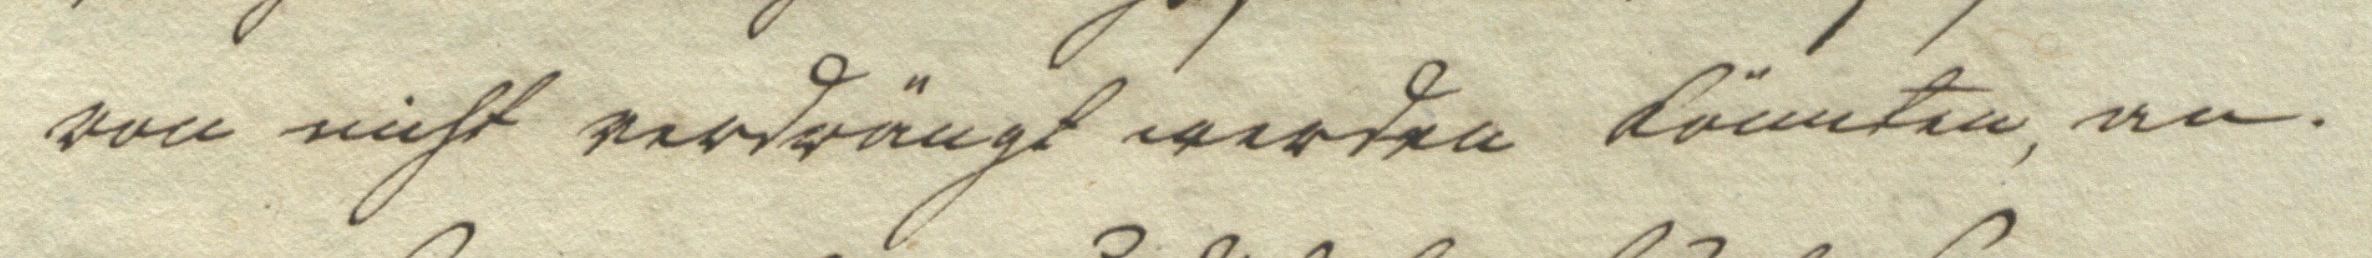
von nicht verdrängt werden könnten, an¬
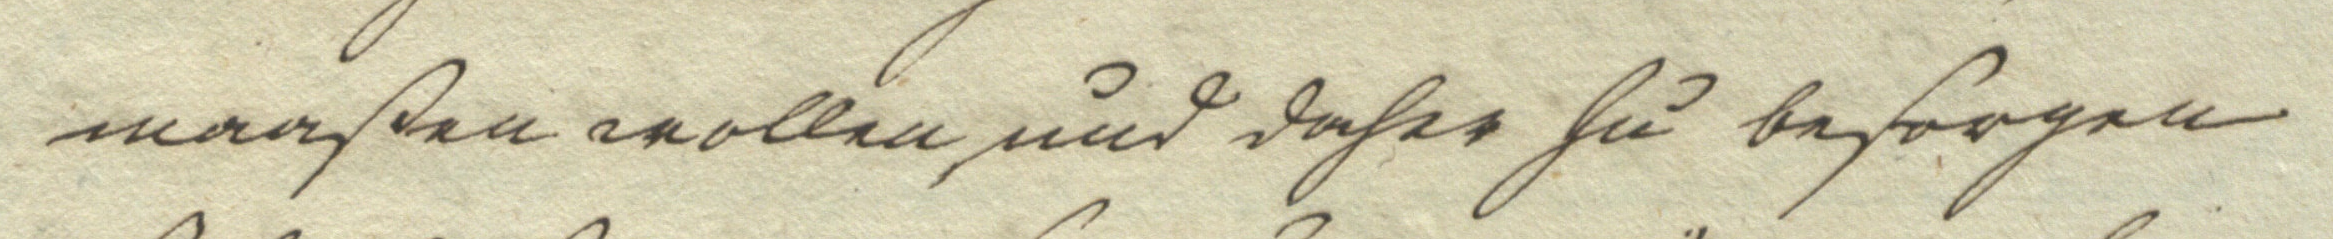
maaßen wollen und daher zu besorgen
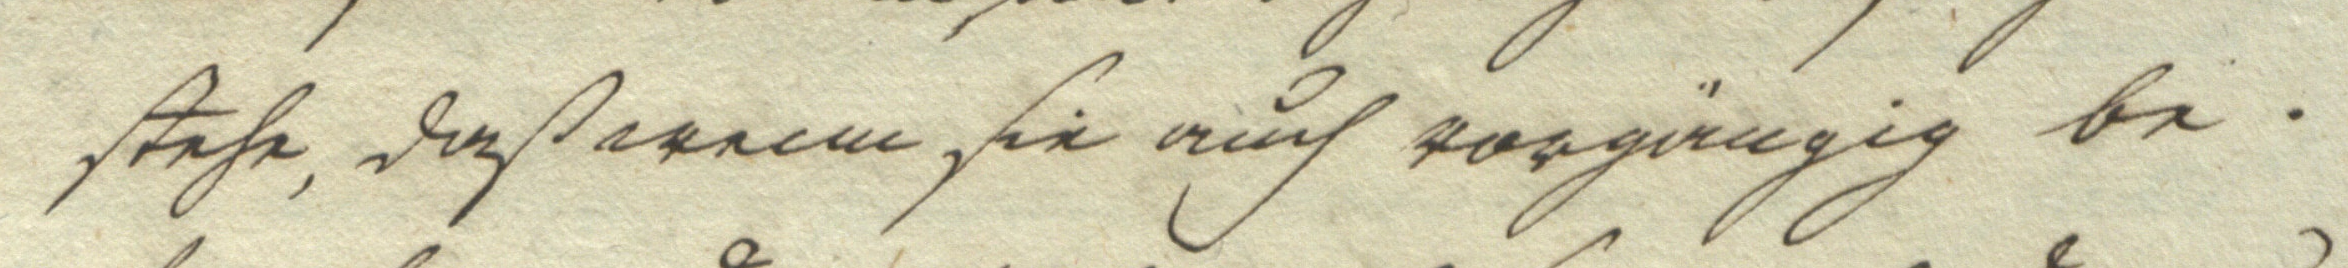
stehe, daß wenn sie auch vorgängig be¬
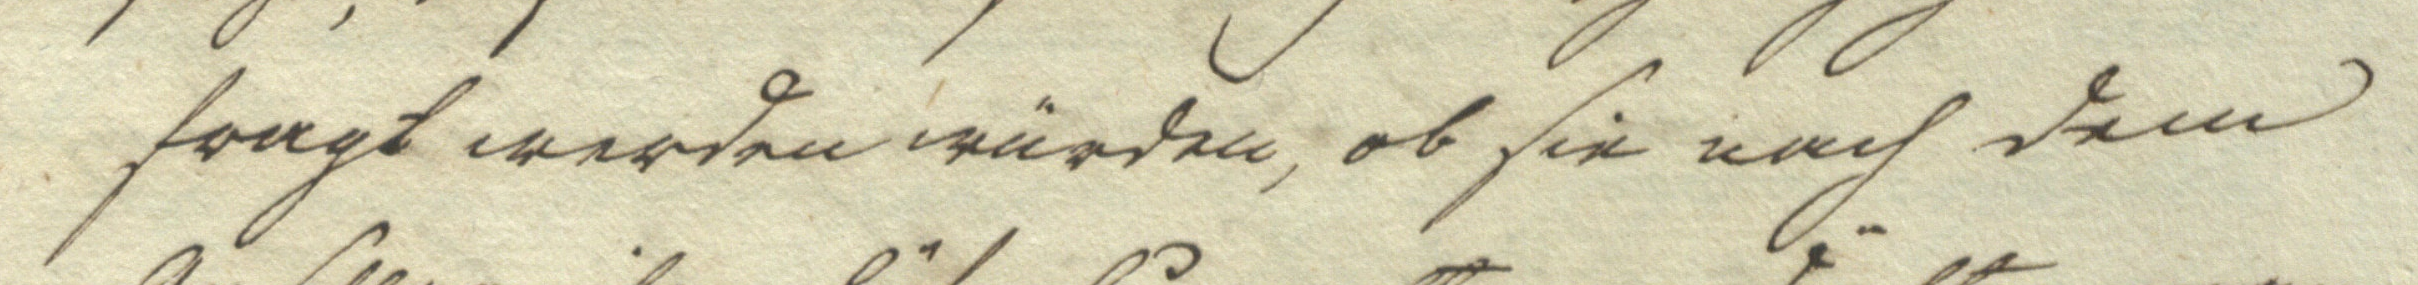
fragt werden würden, ob sie nach dem
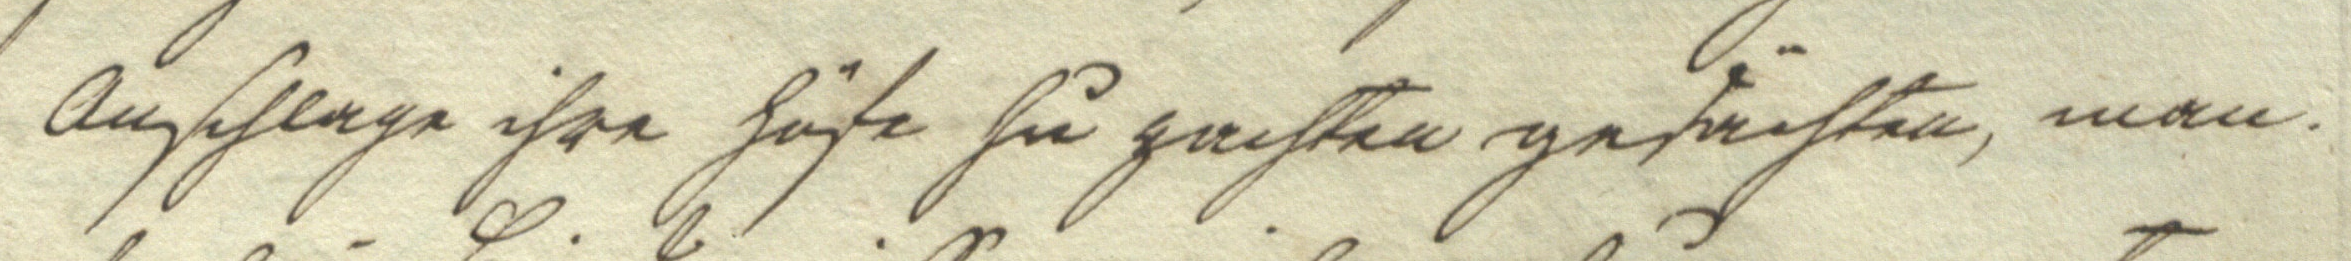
Anschlage ihre Höfe zu pachten gedächten, man¬
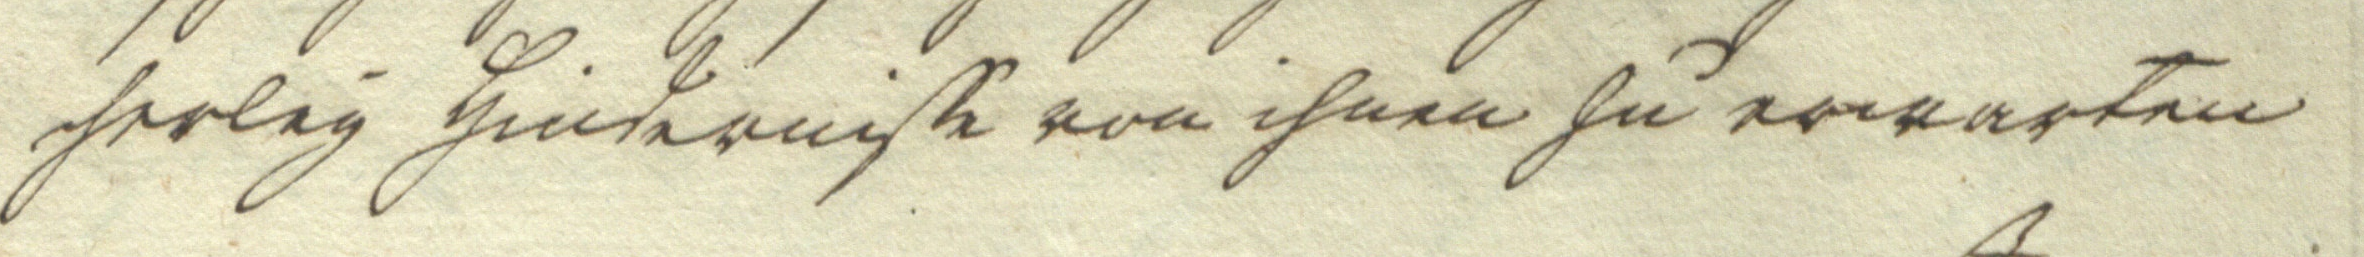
cherleÿ Hindernisse von ihnen zu erwarten
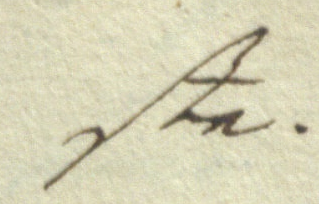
ste¬
